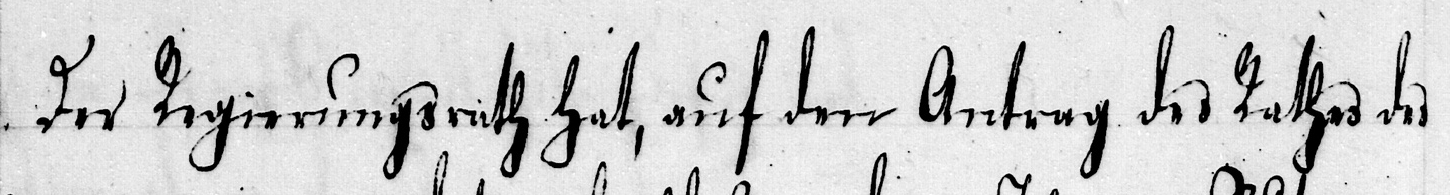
Der Regierungsrath hat, auf den Antrag des Rathes des
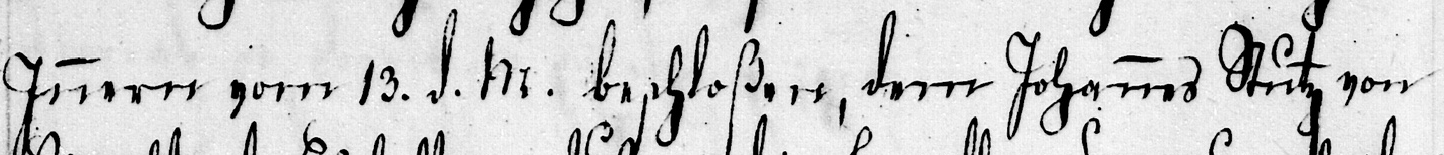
Innern vom 13. d. M. beschloßen, dem Johannes Stutz von
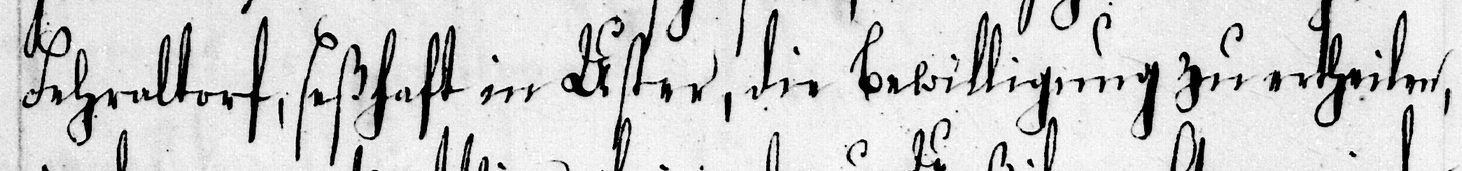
Fehraltorf, seßhaft in Uster, die Bewilligung zu ertheilen,
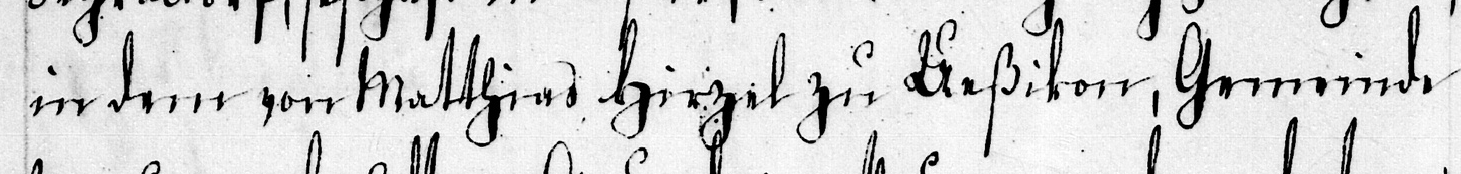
in dem von Matthias Hirzel zu Ueßikon, Gemeinde
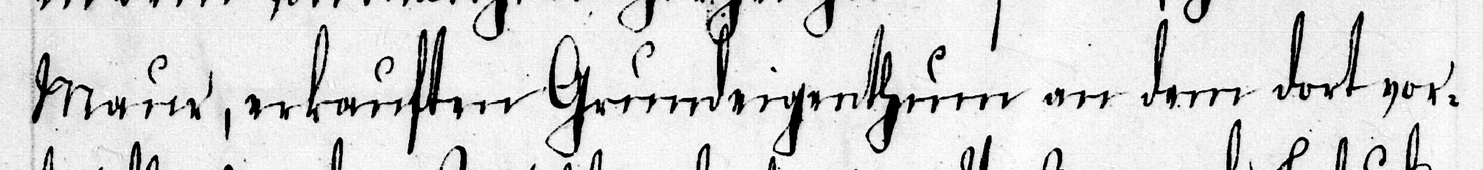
Maur, erkauften Grundeigenthum an dem dort vor¬
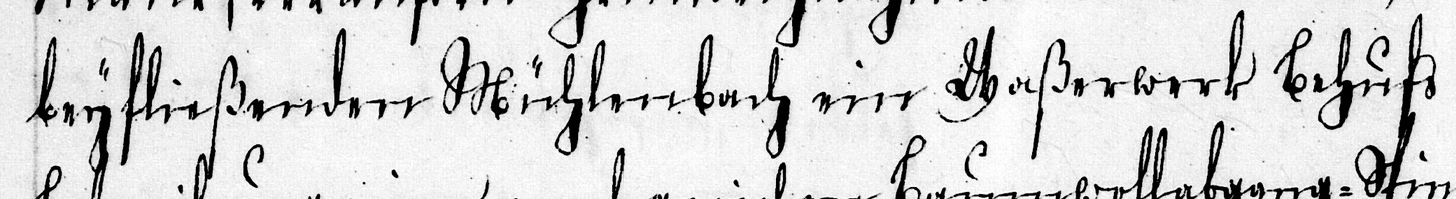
beyfließenden Mühlenbach ein Waßerwerk Behufs
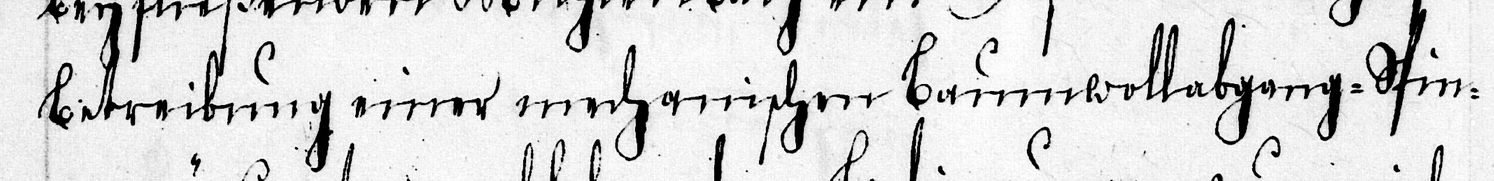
Betreibung einer mechanischen Baumwollabgang-Spin¬
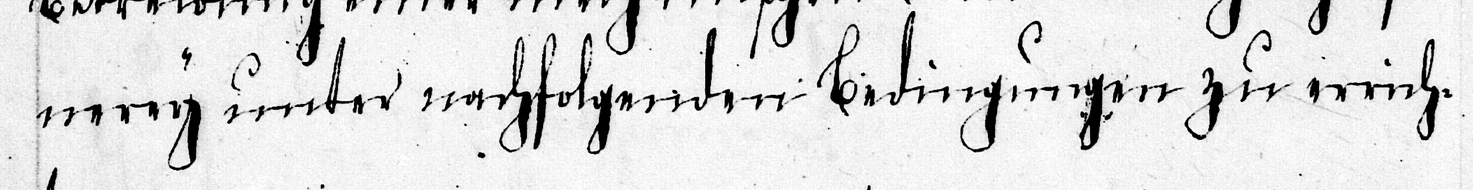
nerey unter nachfolgenden Bedingungen zu errich¬
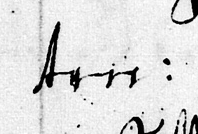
ten:
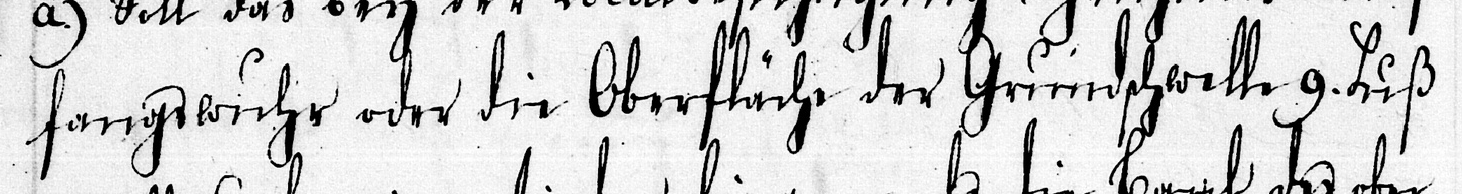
fangswuhr oder die Oberfläche der Grundschwelle 9. Fuß
